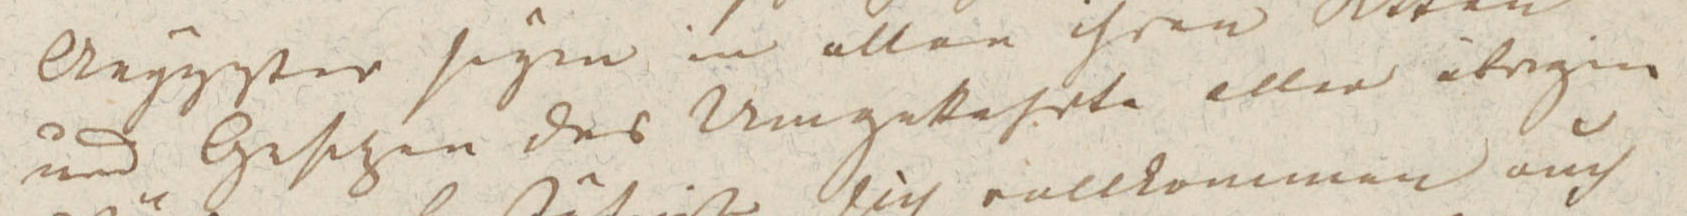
und Gesetzen das Umgekehrte aller übrigen
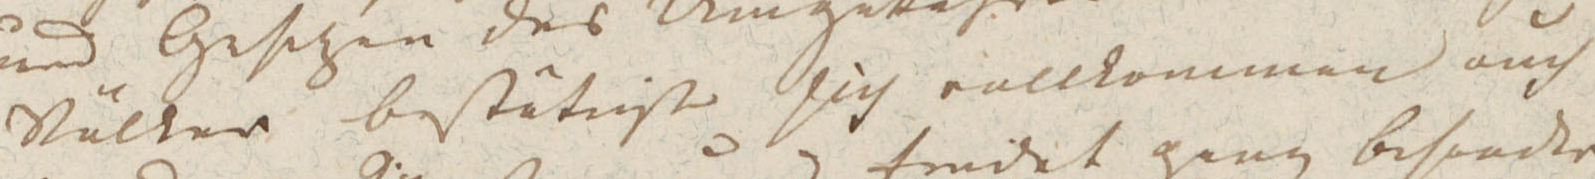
Völker bestätigt sich vollkommen auch
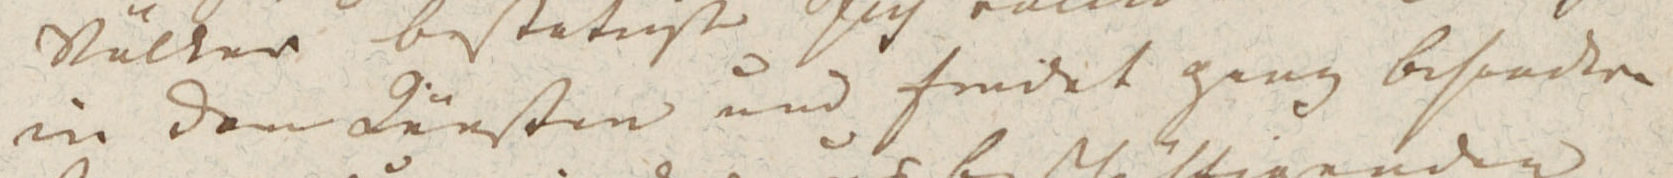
in den Künsten und findet ganz besondere
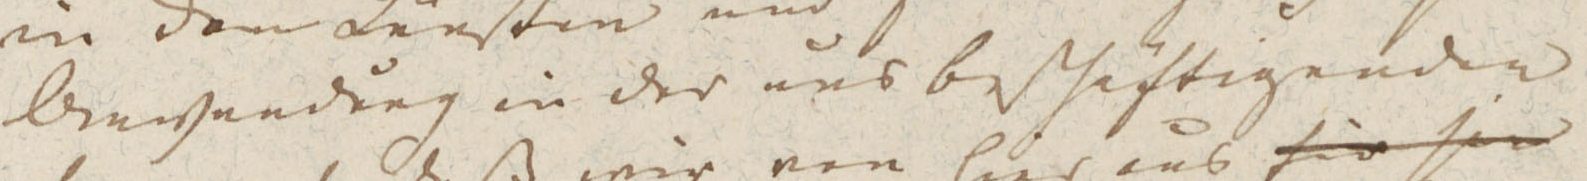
Anwendung in der uns beschäftigenden
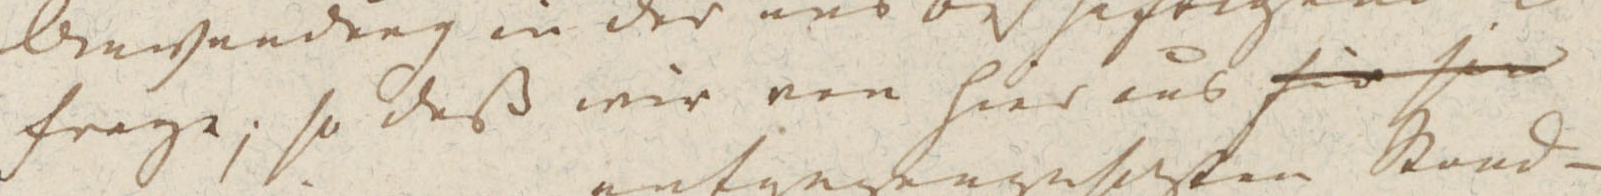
Frage; so dass wir von hier aus für sie
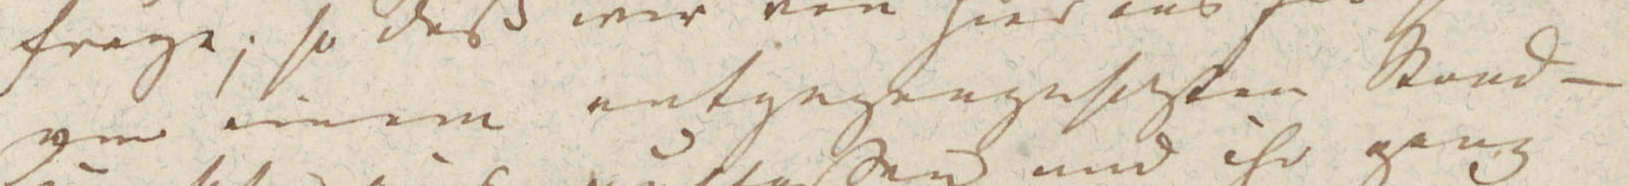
von einem entgegengesetzten Stand-
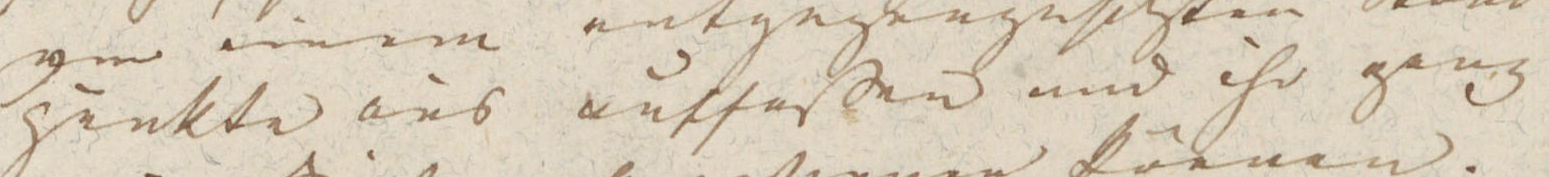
punkte aus auffassen und ihr ganz
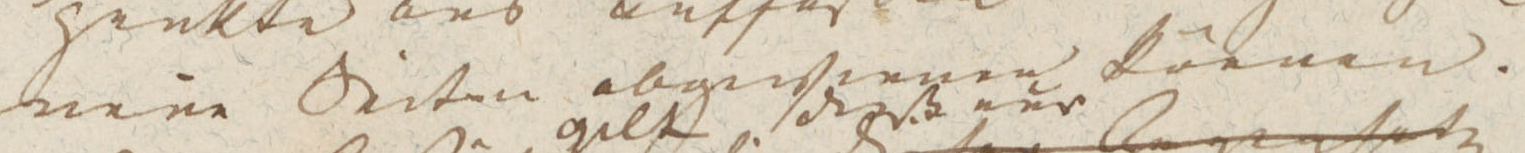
neue Seiten abgewinnen können.
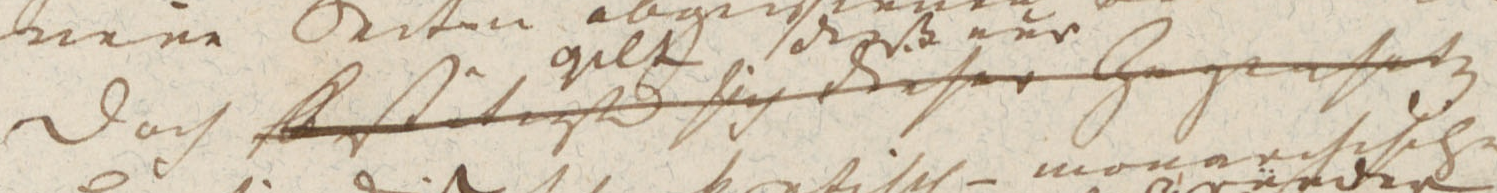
Doch bestätigt sich dieser Gegensatz
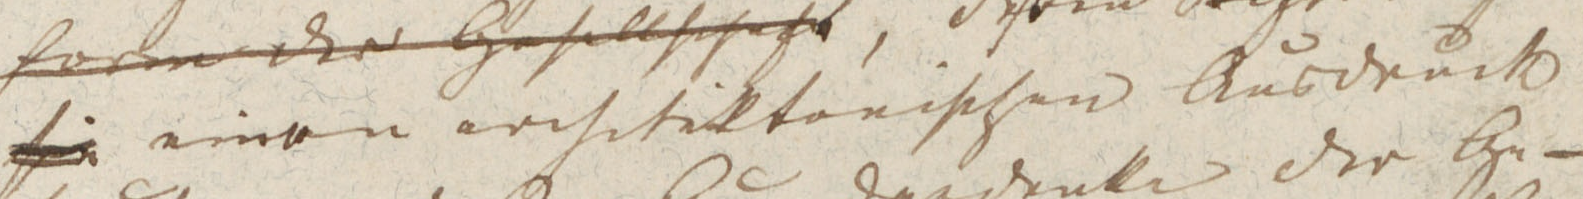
sie einen architektonischen Ausdruck
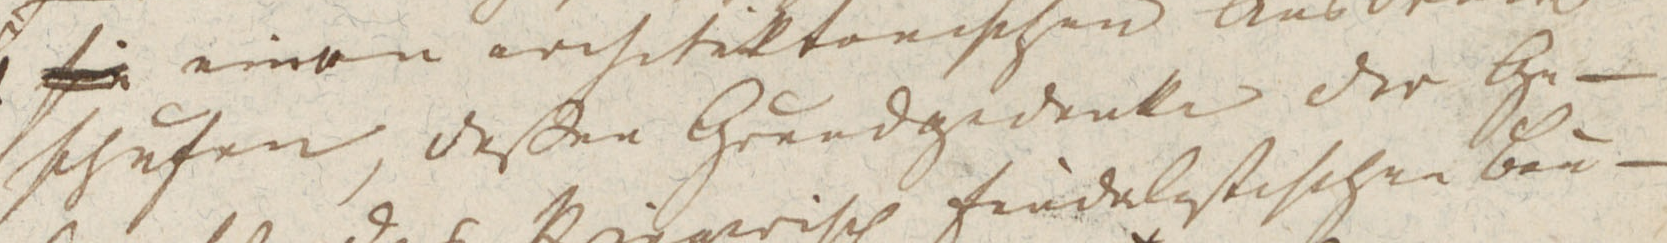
schufen, dessen Grundgedanke der Ge-
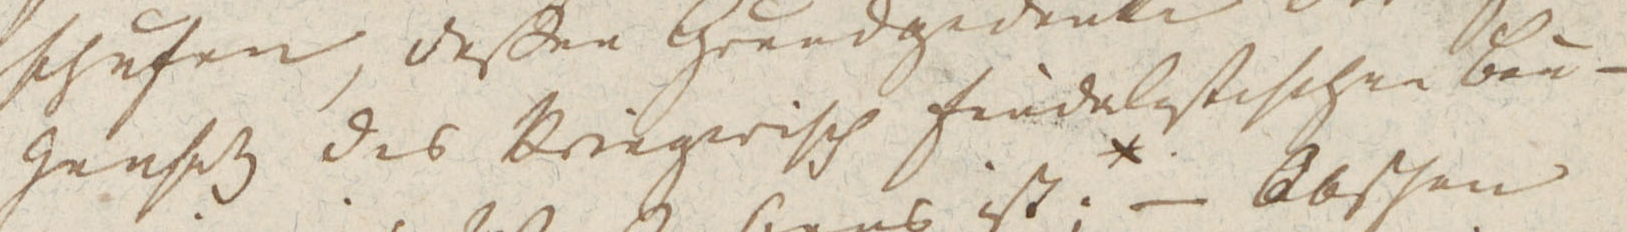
gensatz des kriegerisch feudalistischen Bau-
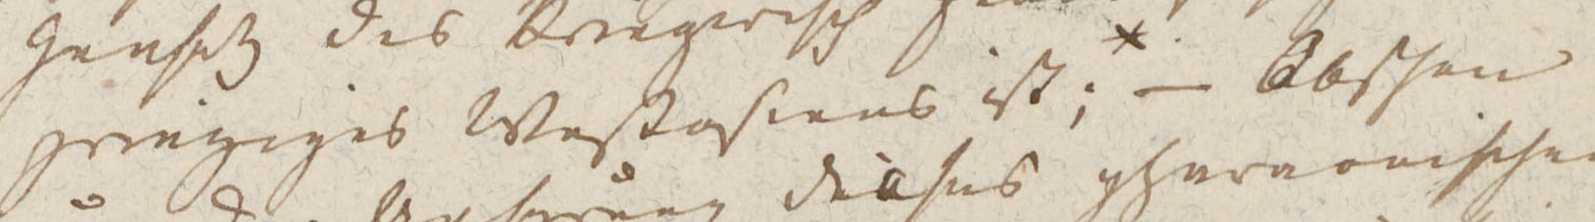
prinzipes Westasiens ist; % – Obschon
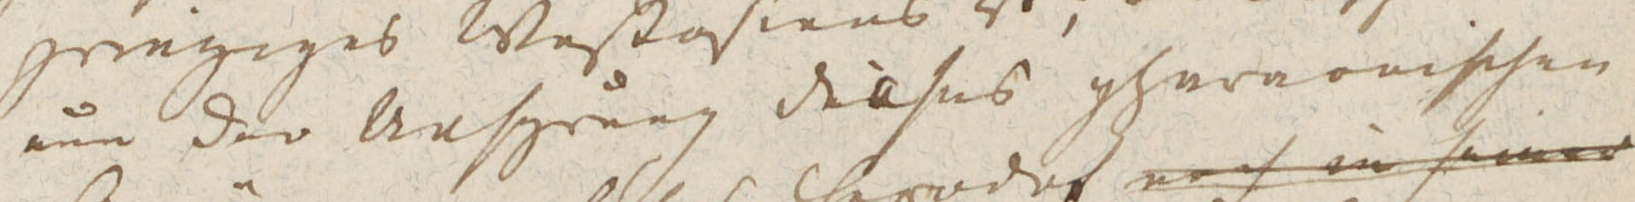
nun der Ursprung dieses pharaonischen
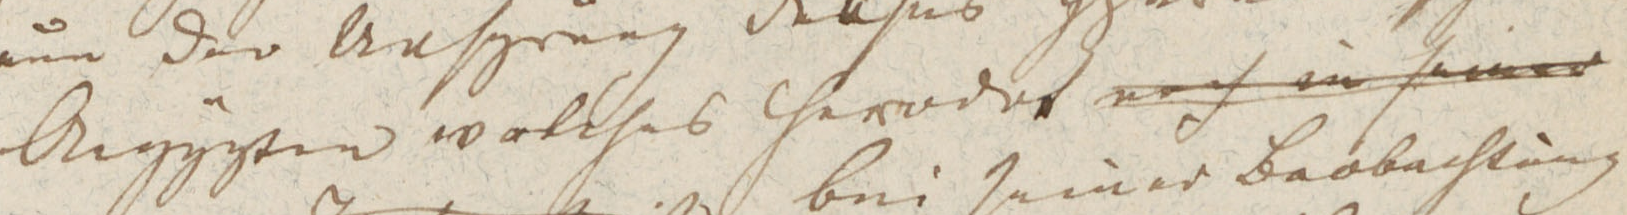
Aegypten welches Herodot noch in seiner
